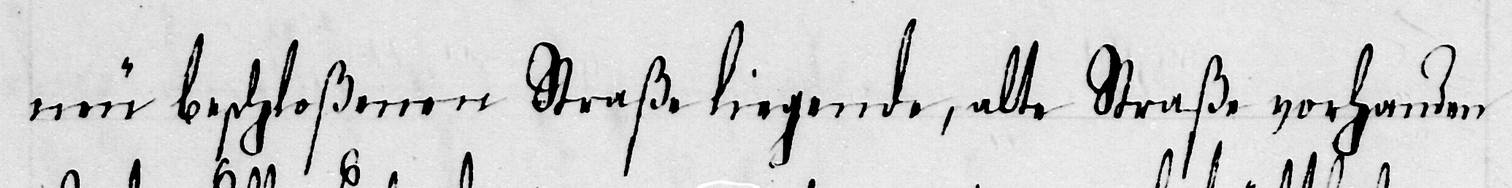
neu beschloßenen Straße liegende, alte Straße vorhanden
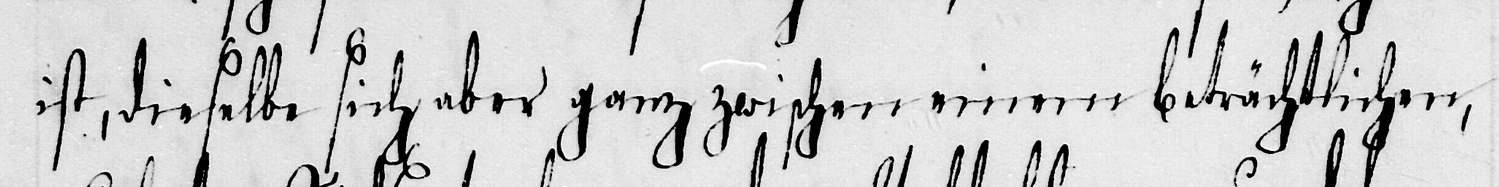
ist, dieselbe aber ganz zwischen einem beträchtlichen,
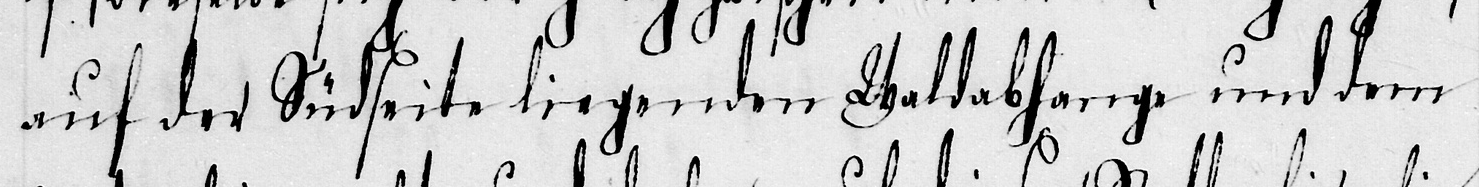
auf der Südseite liegenden Waldabhange und dem
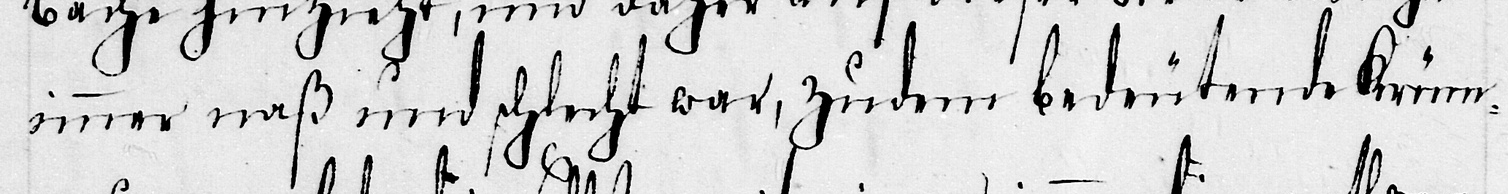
immer naß und schlecht war, zudem bedeutende Krüm¬
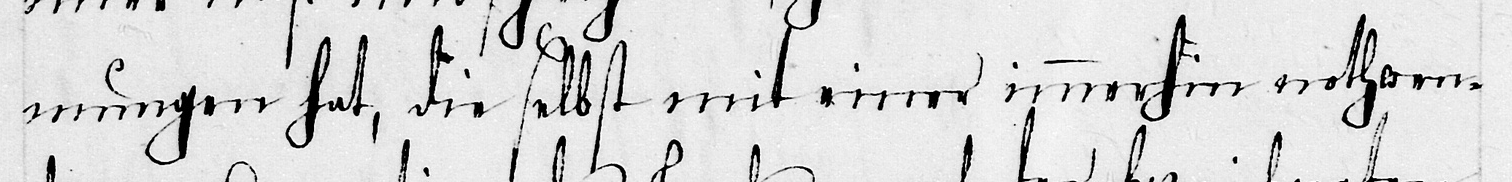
mungen hat, die selbst mit einer immerhin nothwen¬
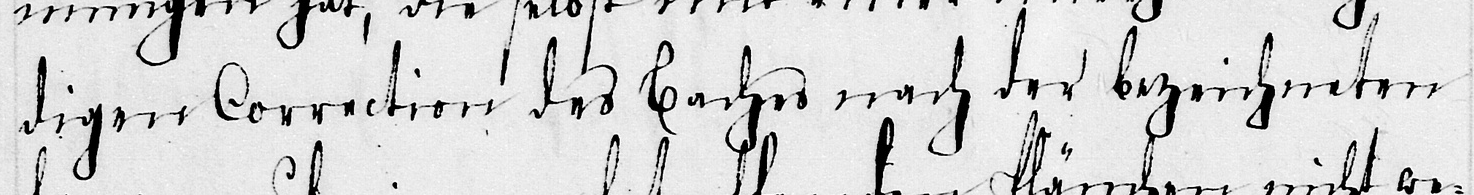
digen Correction des Baches nach der bezeichneten
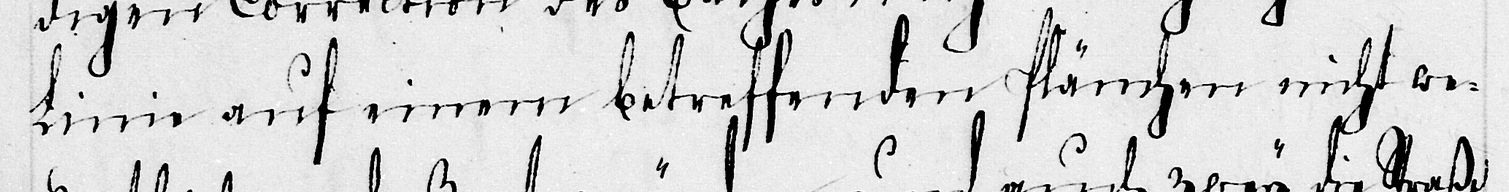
Linie auf einem betreffenden Plänchen nicht we¬
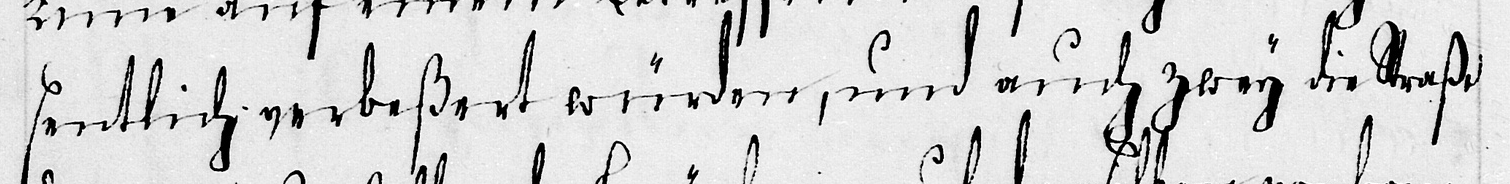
sentlich verbeßert würden, und auch zwey die Straße
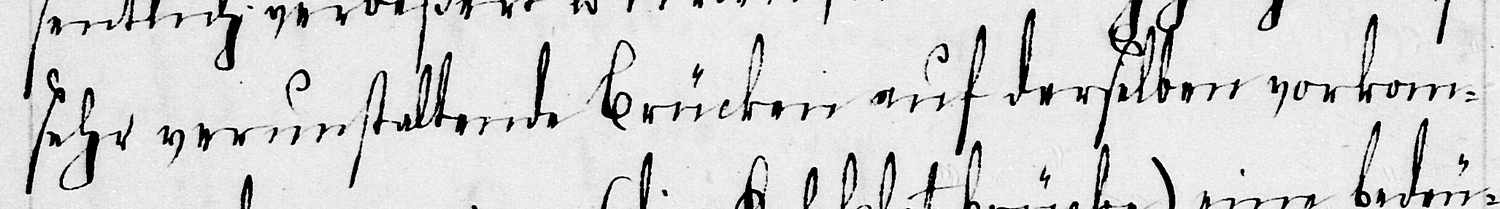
sehr verunstaltende Brücken auf derselben vorkom¬
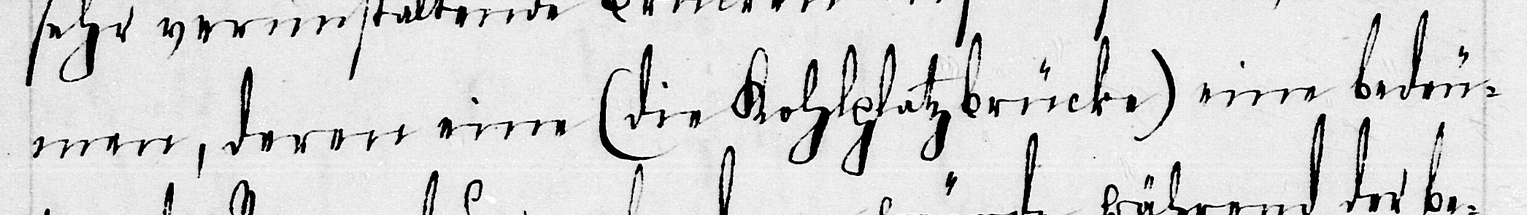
men, davon eine (die Kohlplatzbrücke) eine bedeu¬
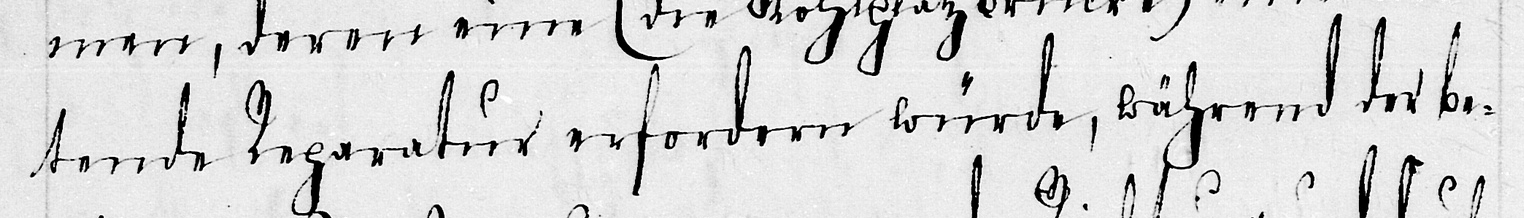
tende Reparatur erfordern würde, während der be¬
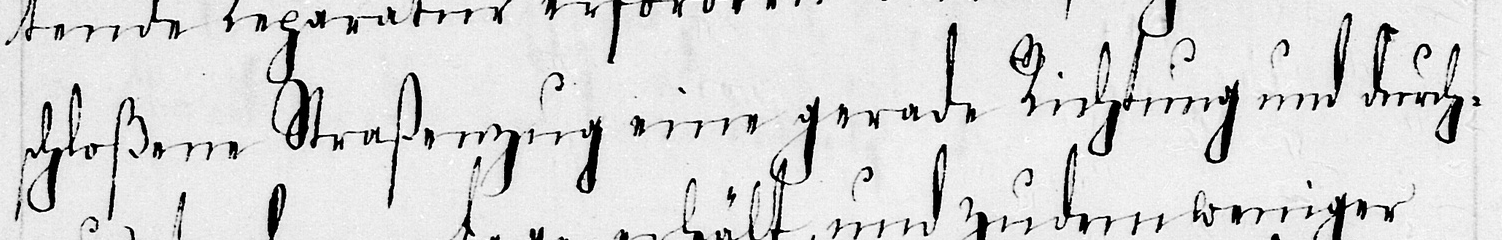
schloßene Straßenzug eine gerade Richtung und durch¬
